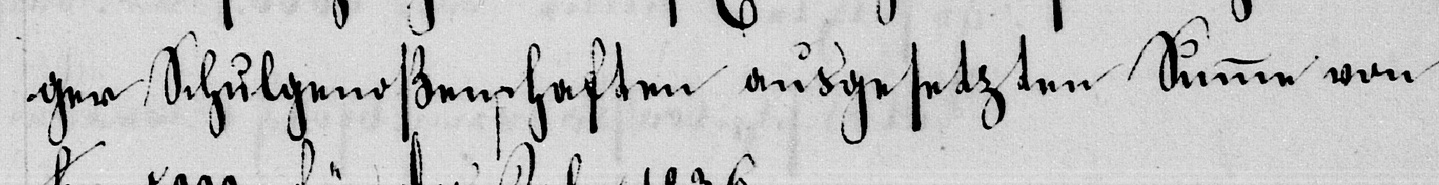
ger Schulgenoßenschaften ausgesetzten Summe von
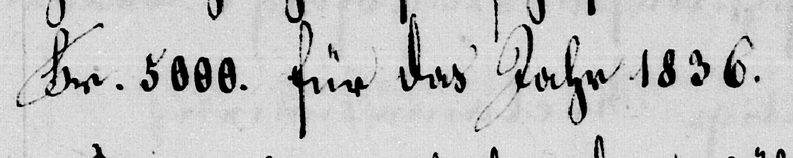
Fr. 5000. für das Jahr 1836.
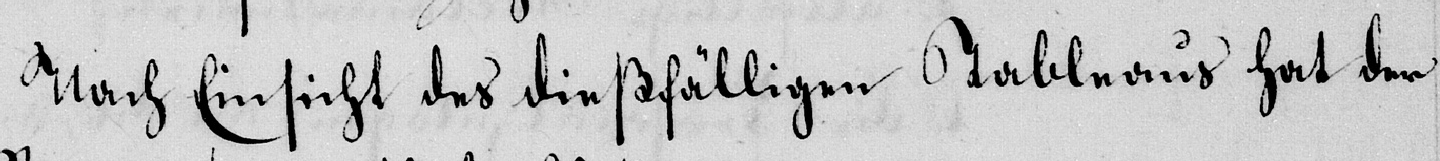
Nach Einsicht des dießfälligen Tableaus hat der
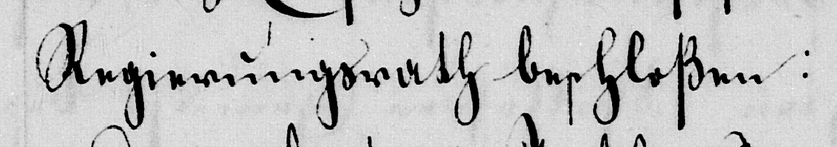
Regierungsrath beschloßen:
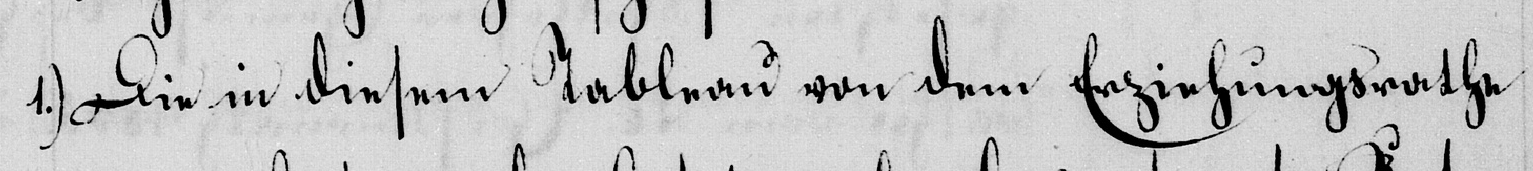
1.) Die in diesem Tableau von dem Erziehungsrathe
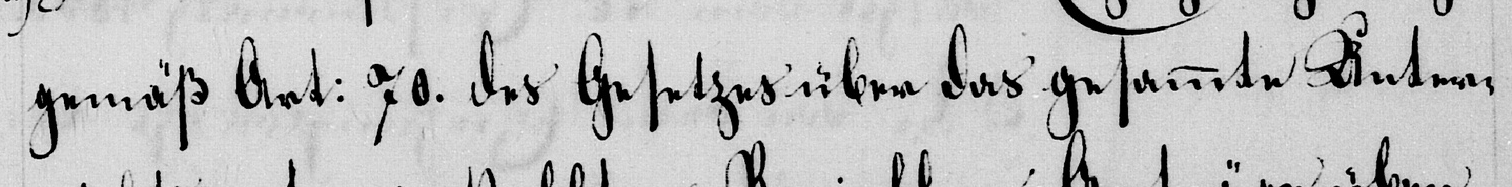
gemäß Art: 70. des Gesetzes über das gesammte Unter¬
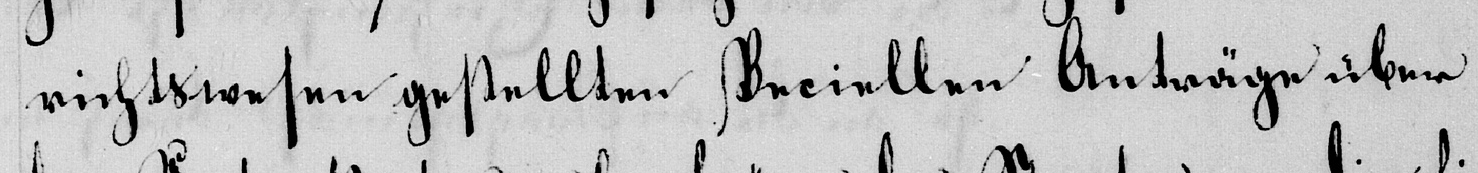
richtswesen gestellten speciellen Anträge über
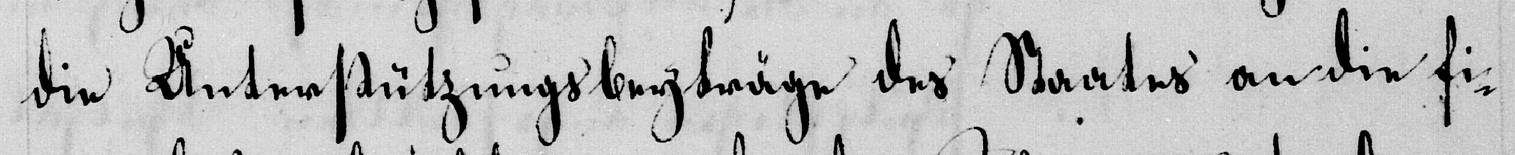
die Unterstützungsbeyträge des Staates an die fi¬
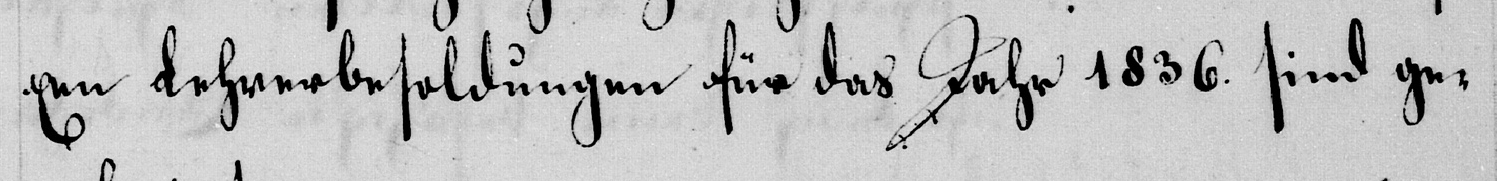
xen Lehrerbesoldungen für das Jahr 1836. sind ge¬
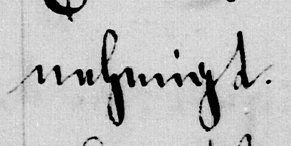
nehmigt.
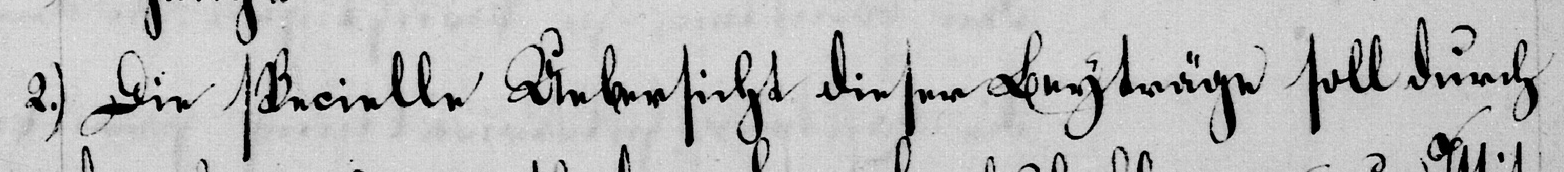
2.) Die specielle Uebersicht dieser Beyträge soll durch
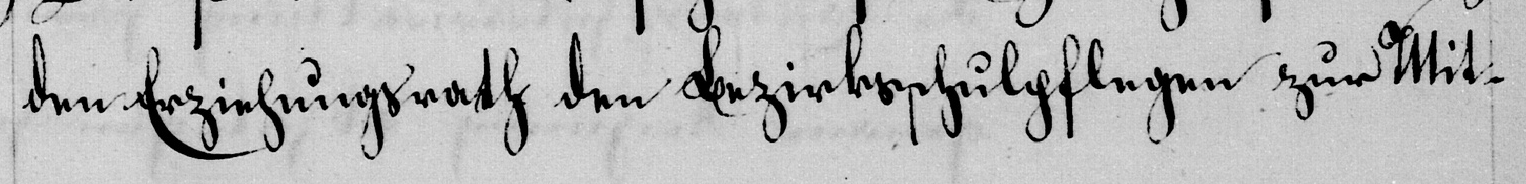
den Erziehungsrath den Bezirksschulpflegen zur Mit-
